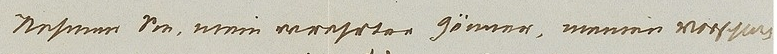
Nehmen Sie, mein verehrter Gönner, meinen Vorschlag
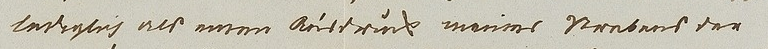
lediglich als einen Ausdruck meines Strebens der
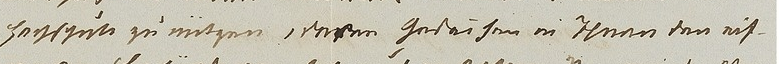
Hochschule zu nützen, deren Gedeihen in Ihnen den eif-
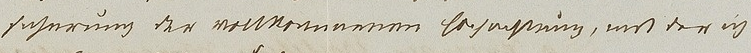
sicherung der vollkommenen Hochachtung, mit der ich
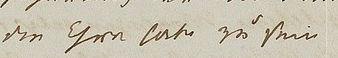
die Ehre habe zu sein
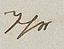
Ihr
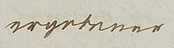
ergebener
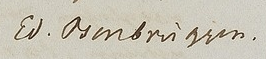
Ed. Osenbrüggen.
